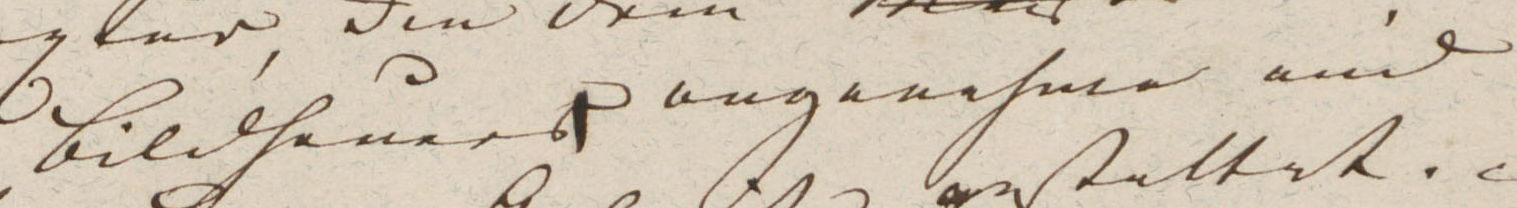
Bildhauers angenehme und
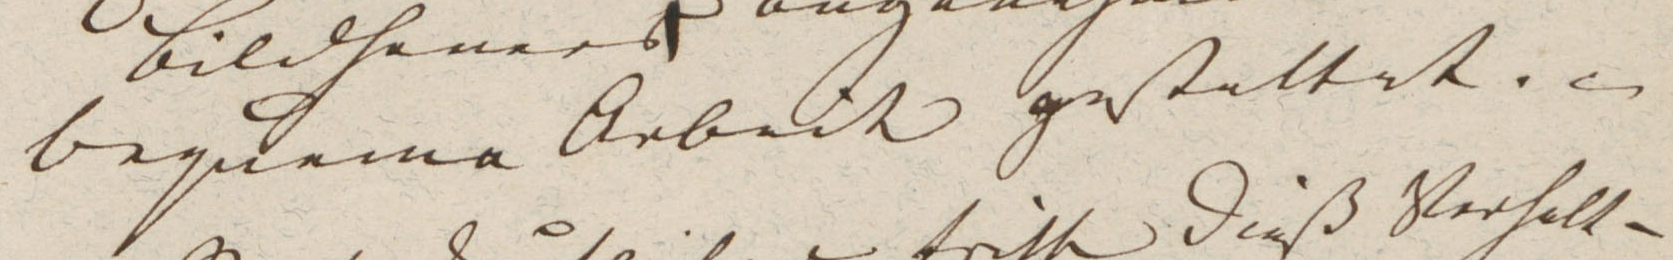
bequeme Arbeit gestattet. –
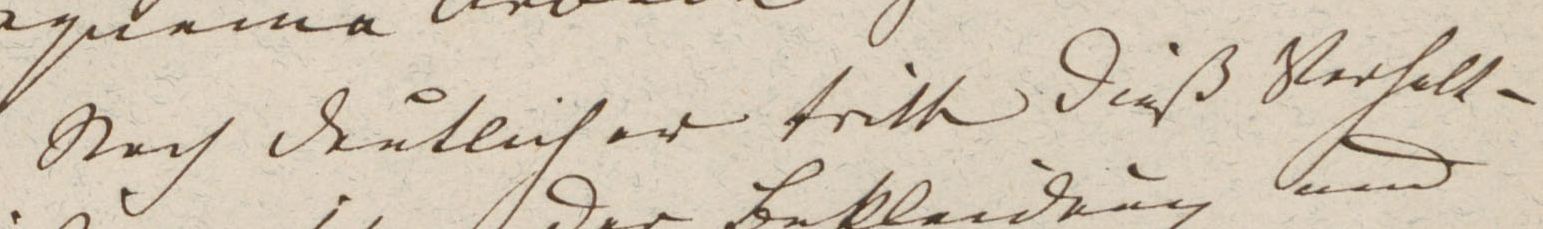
Noch deutlicher tritt diess Verhalt-
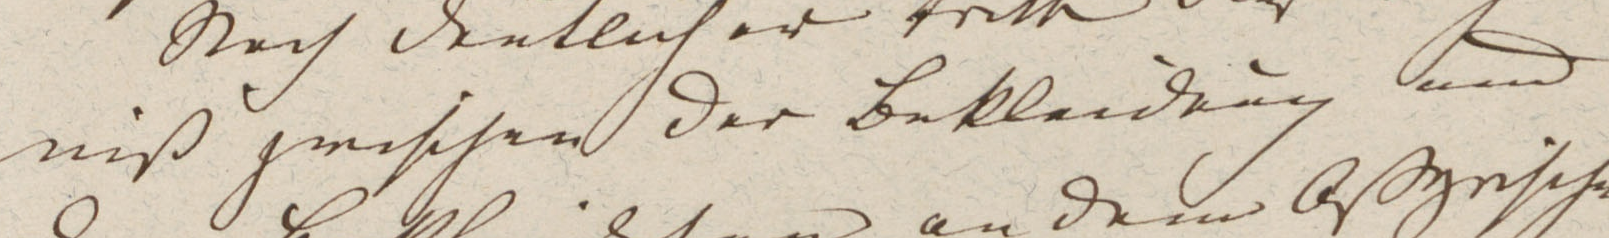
niss zwischen der Bekleidung und
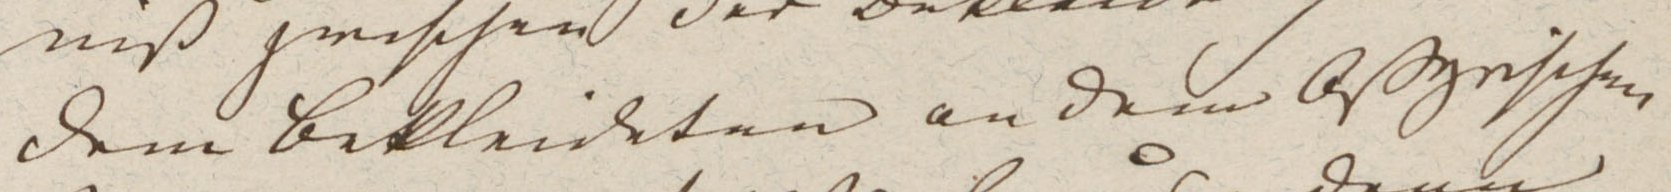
dem Bekleideten an dem Assyrischen
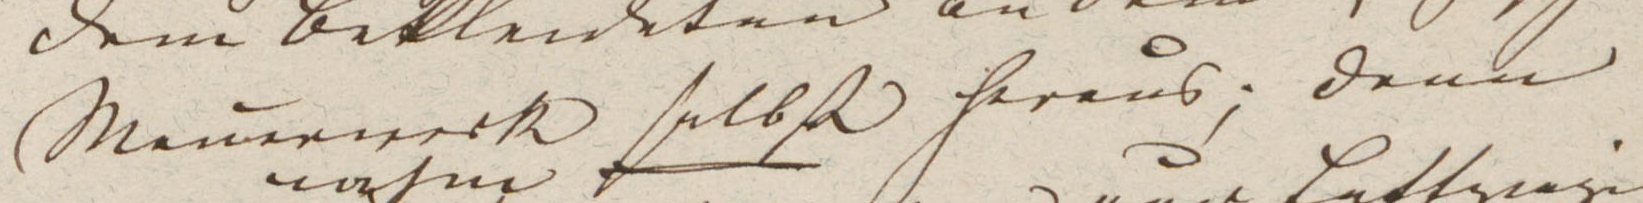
Mauerwerk selbst heraus; denn
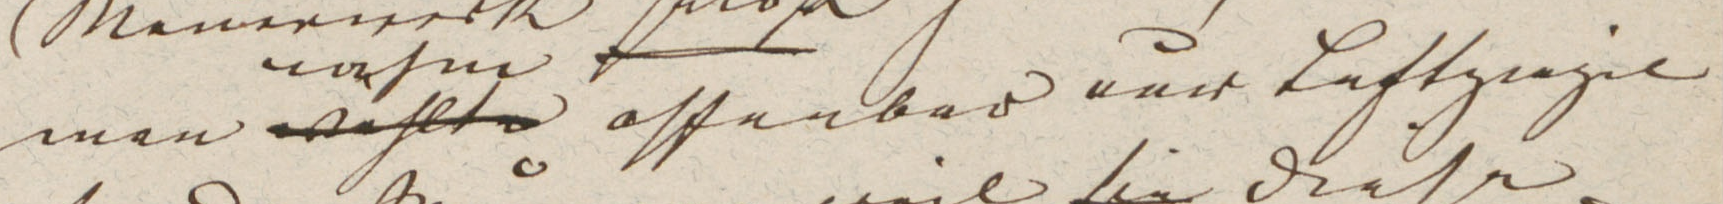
man wählte nahm offenbar nur Luftziegel
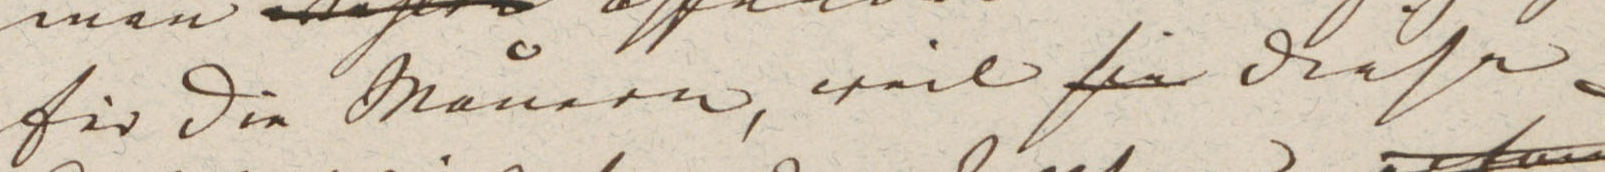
für die Mauern, weil sie diese
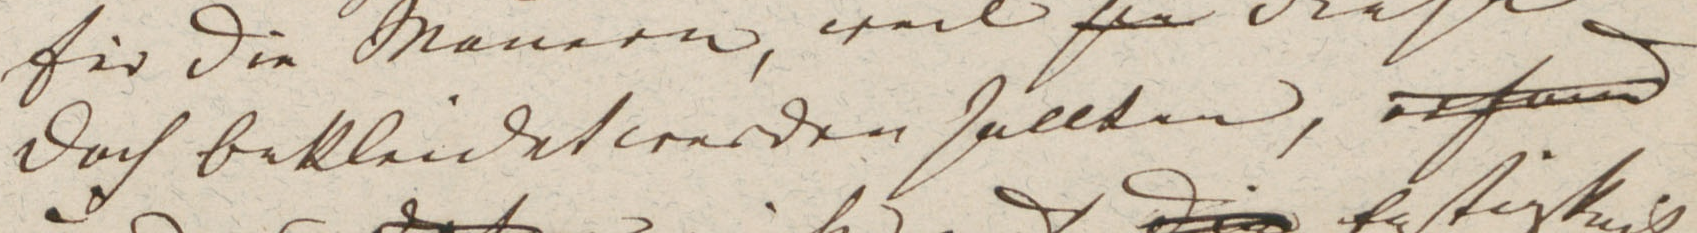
doch bekleidet werden sollten, erfand
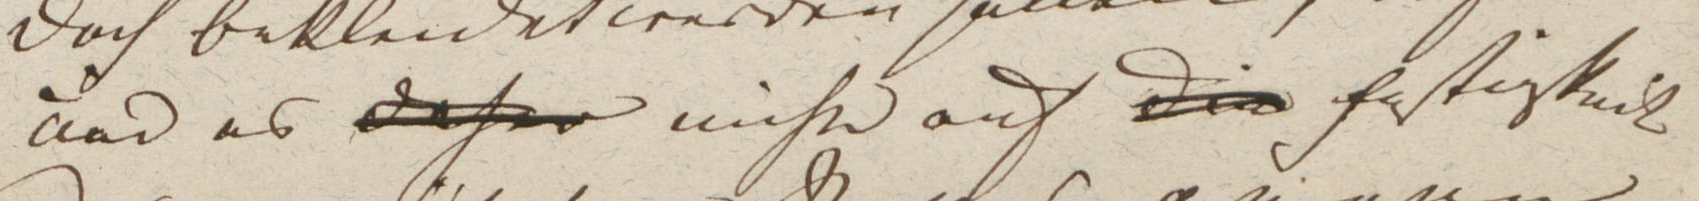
und es daher nicht auf die Festigkeit
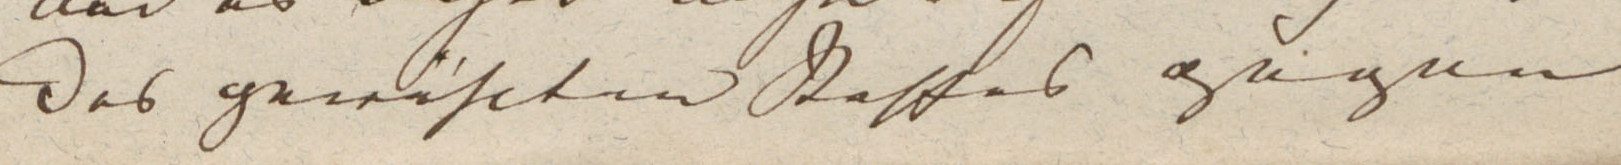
des gewählten Stoffes gegen
